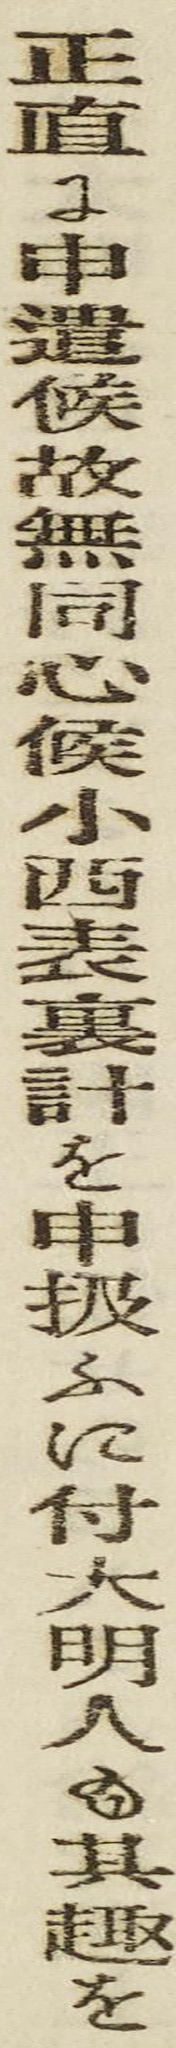正直に申遣候故無同心候小西表裏計を申扱ふに付大明人も其趣を
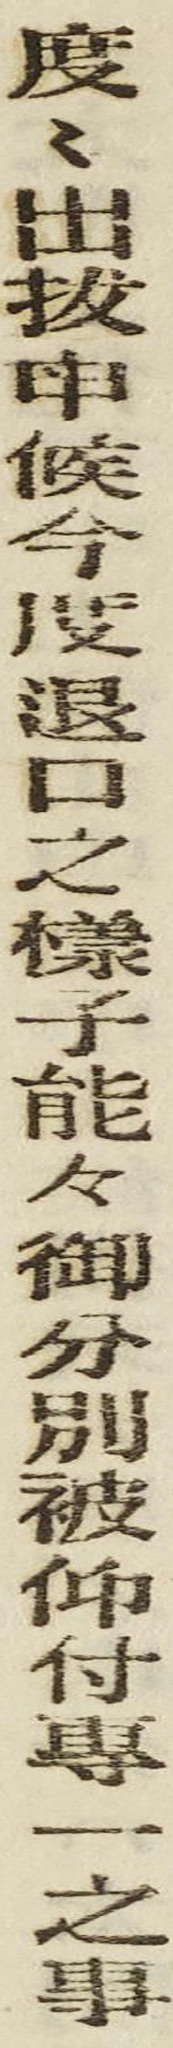度〻出抜申候今度退口之様子能々御分別被仰付専一之事
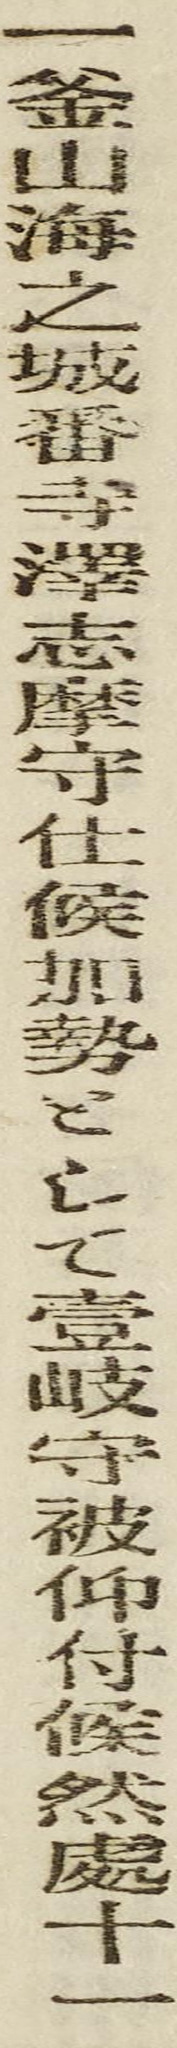一釜山海之城番寺沢志摩守仕候加勢として壱岐守被仰付候然処十一
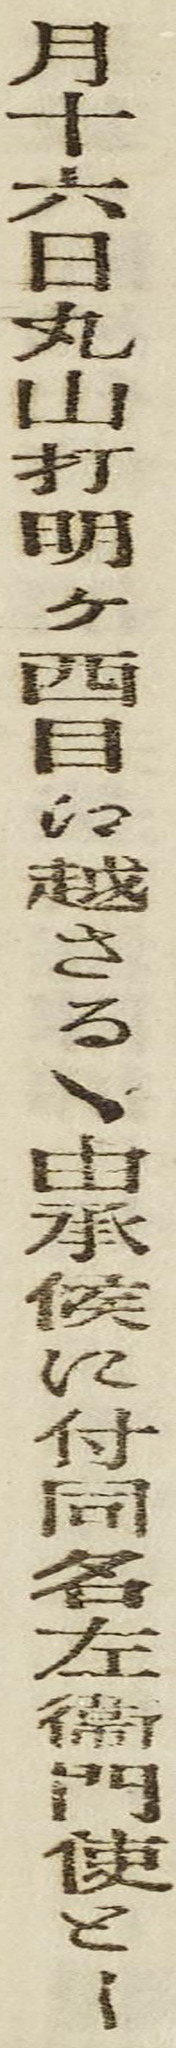月十六日丸山打明け西目え越さるゝ由承候に付同名左衛門使とし
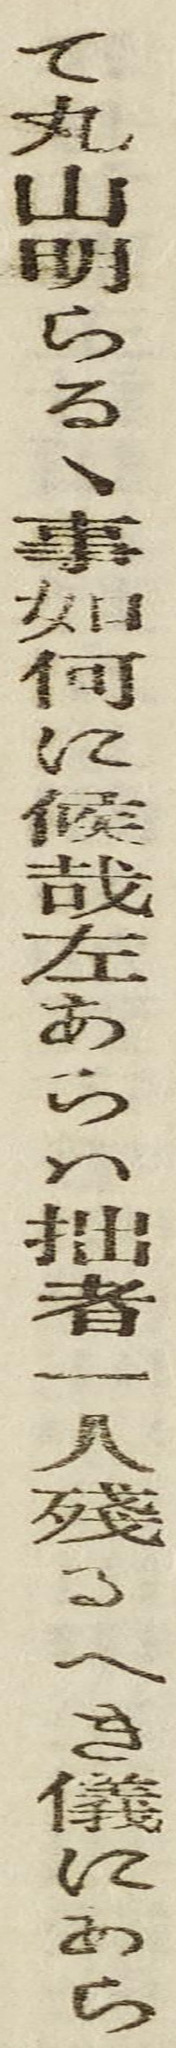て丸山明らるゝ事如何に候哉左あらは拙者一人残るへき儀にあら
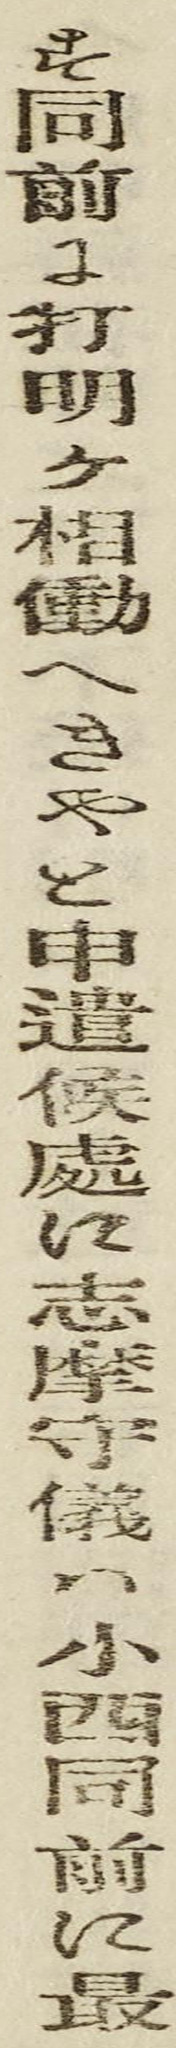す同前に打明け相働へきやと申遣候処に志摩守儀は小西同前に最
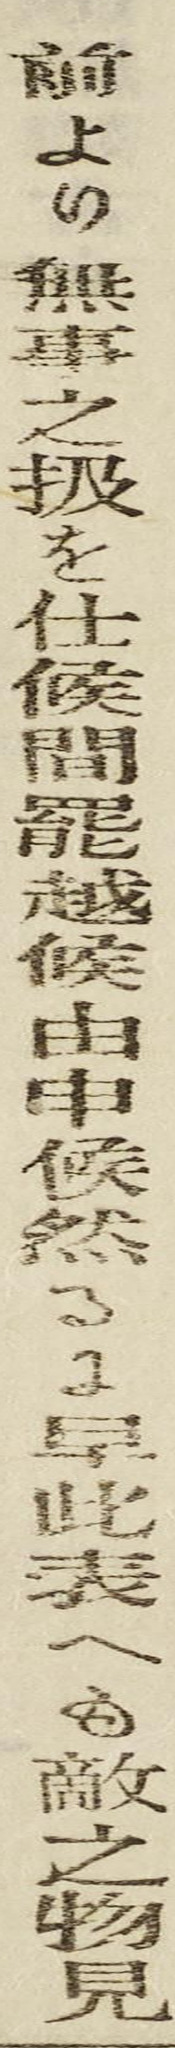前より無事之扱を仕候間罷越候由申候然るに早此表へも敵之物見
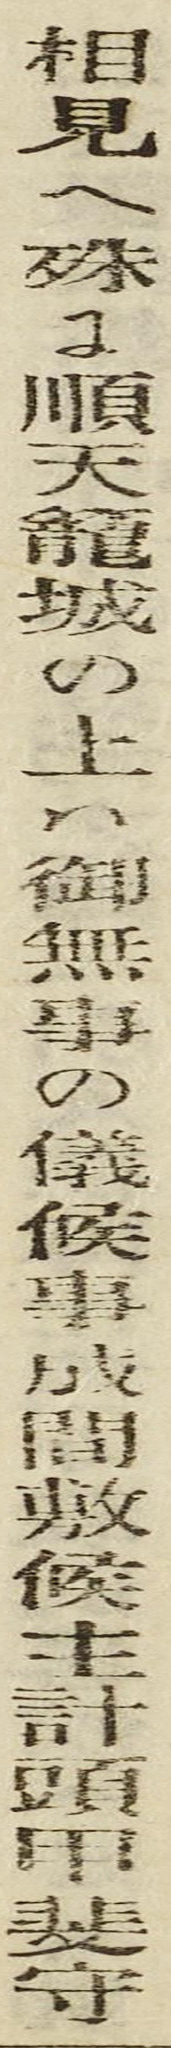相見へ殊に順天籠城の上は御無事の儀候事成間敷候主計頭甲斐守
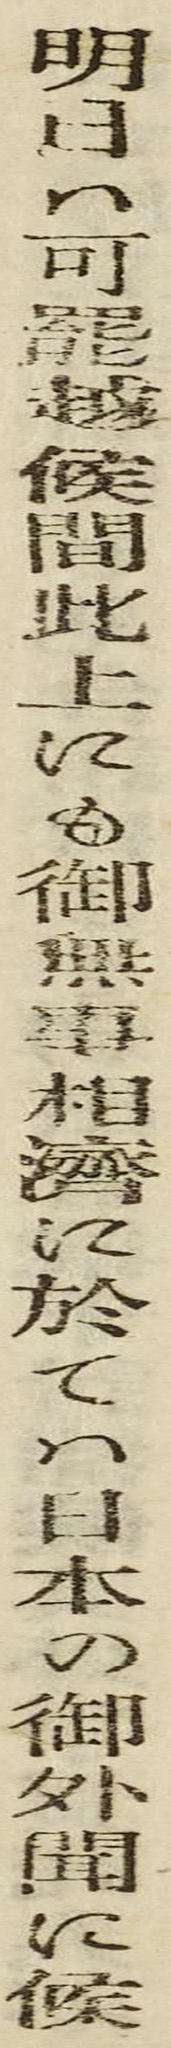明日は可罷越候間此上にも御無事相済に於ては日本の御外聞に候
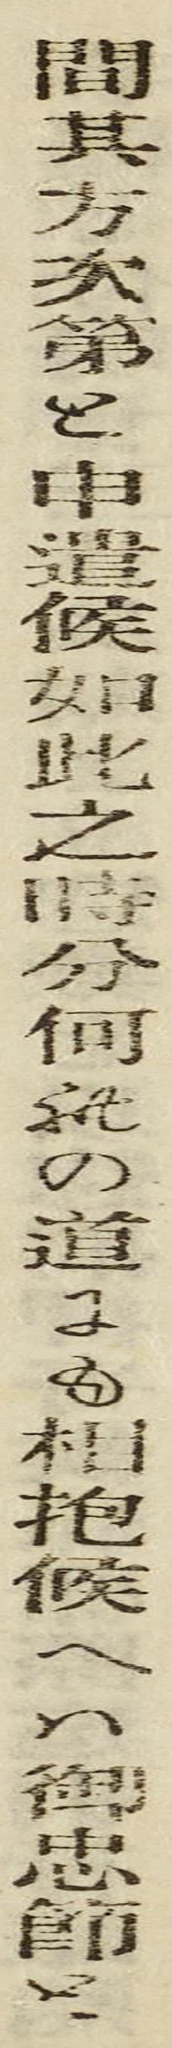間其方次第と申遣候如此之時分何れの道にも相抱候へは御忠節と
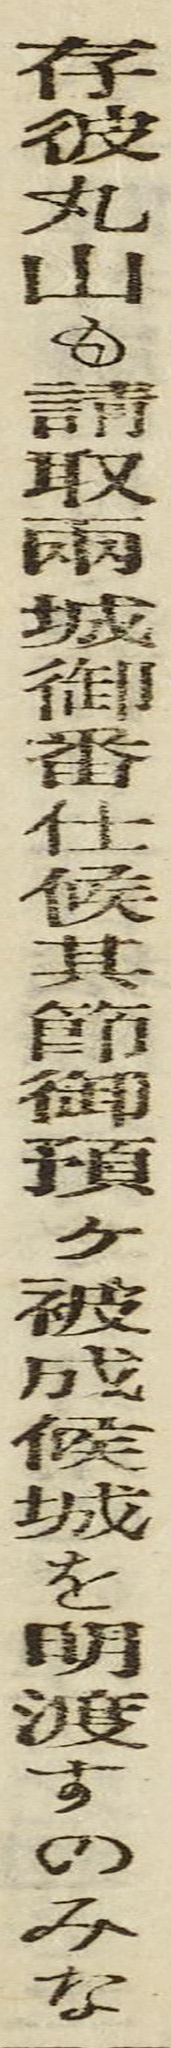存彼丸山も請取両城御番仕候其節御預け被成候城を明渡すのみな
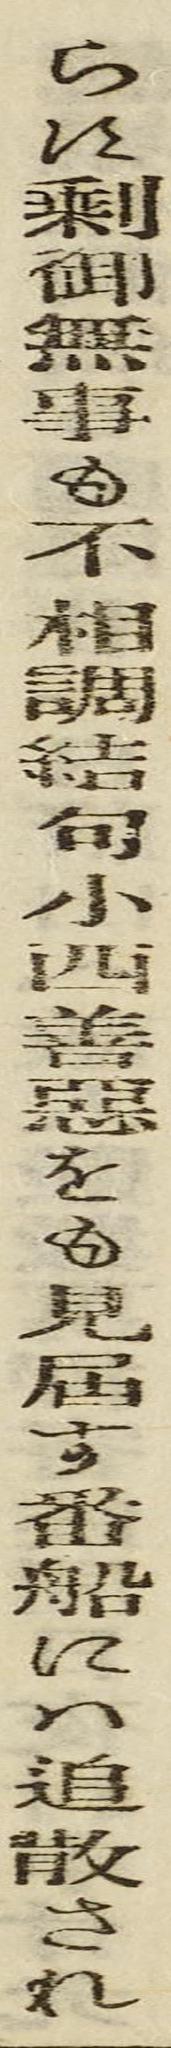らす剰御無事も不相調結句小西善悪をも見届す番船には追散され
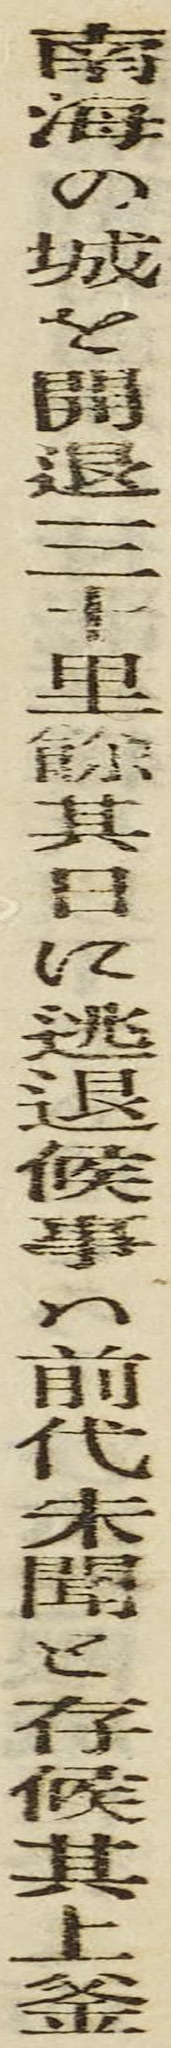南海の城を開退三十里余其日に逃退候事は前代未聞と存候其上釜
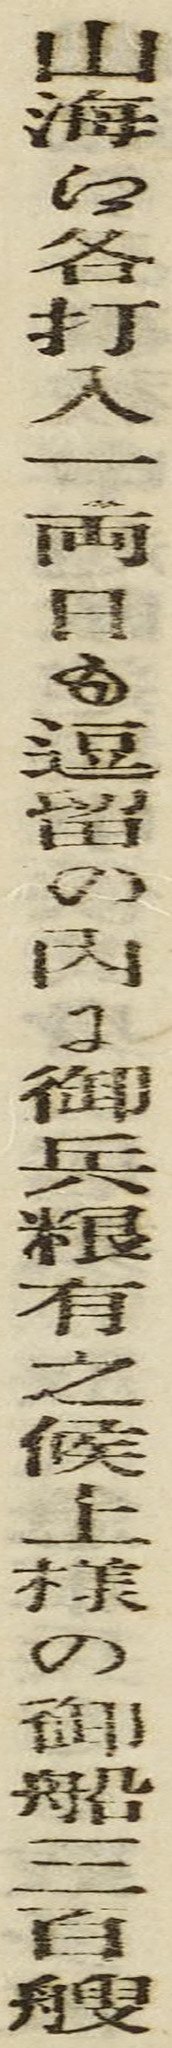山海え各打入一両日も逗留の内に御兵糧有之候上様の御船三百艘
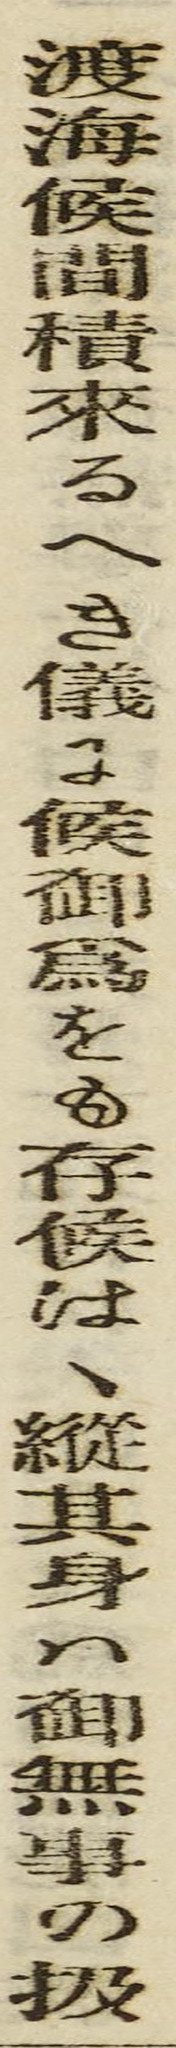渡海候間積来るへき儀に候御為をも存候はゝ縦其身は御無事の扱
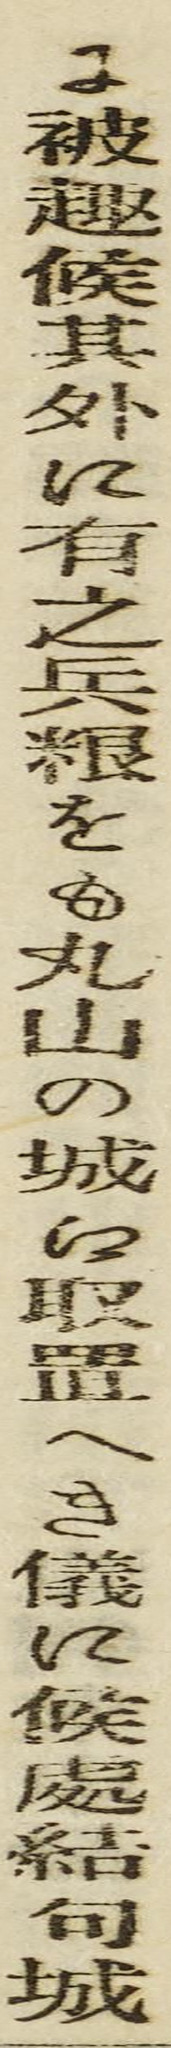に被趣候其外に有之兵糧をも丸山の城え取置へき儀に候処結句城
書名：史籍集覽　朝鮮陣古文・細井廣澤記・颶風紀事・天明七年將軍宣下次第書　全
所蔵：東京大学地震研究所図書室 Earthquake Research Institute Library, The University of Tokyo, JAPAN
